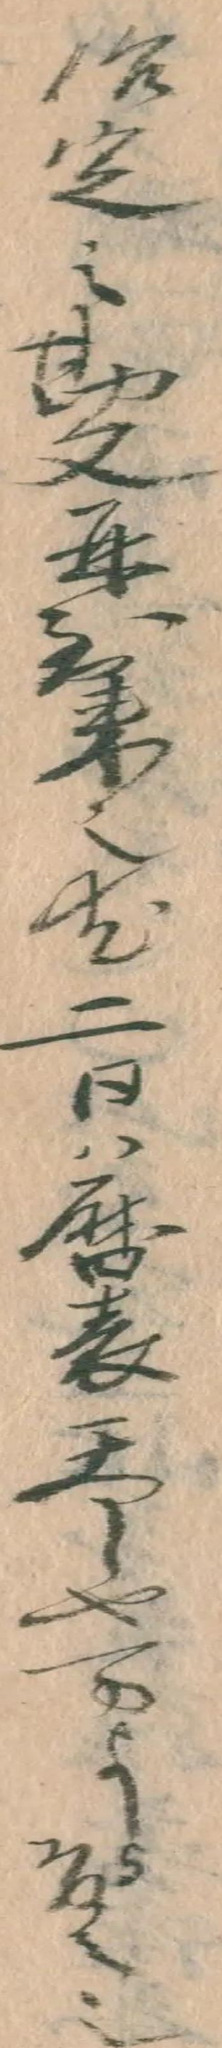治定之勘文再到来也尤二日は暦表天しや万よしと有之也
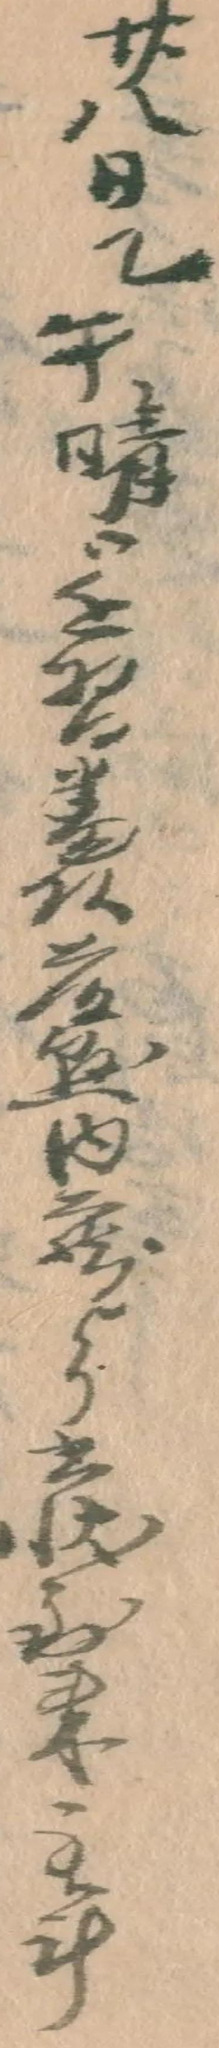廿八日乙午時御近習番頭藤懸内蔵より書状到来主斗
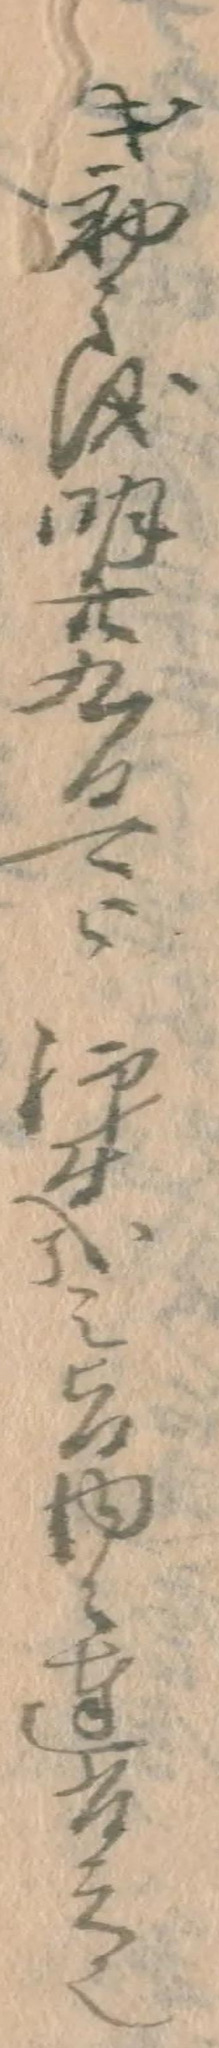出勤之儀明廿九日可被仰付哉之旨内々達有之也
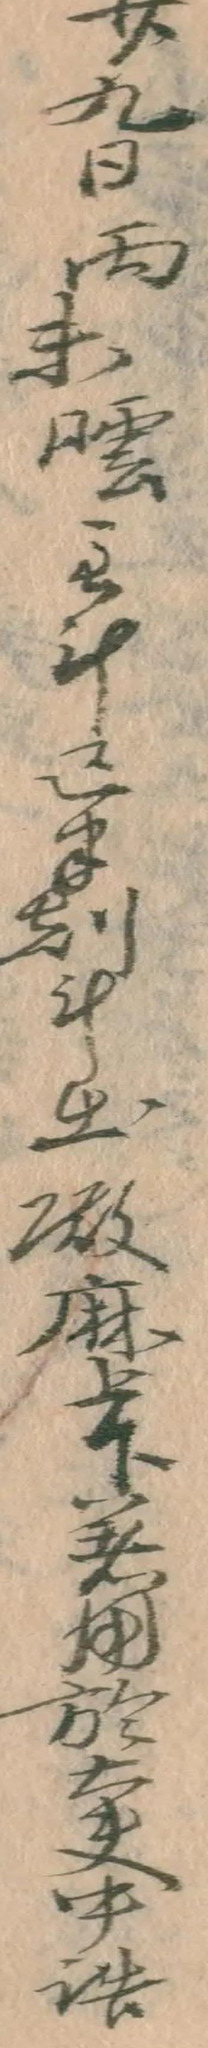廿九日丙未曇主斗巳半刻斗出殿麻上下着用於大夫中詰
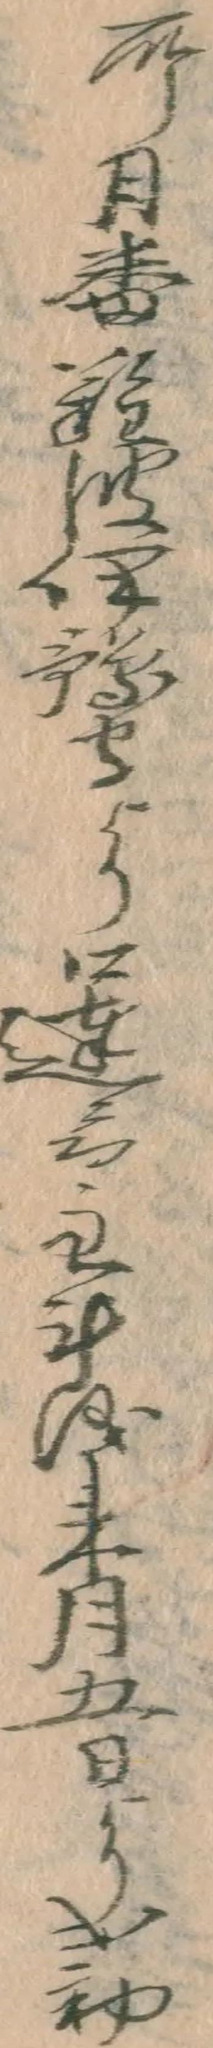所月番難波伊豫守より口達ニ而主斗儀来月五日より出勤
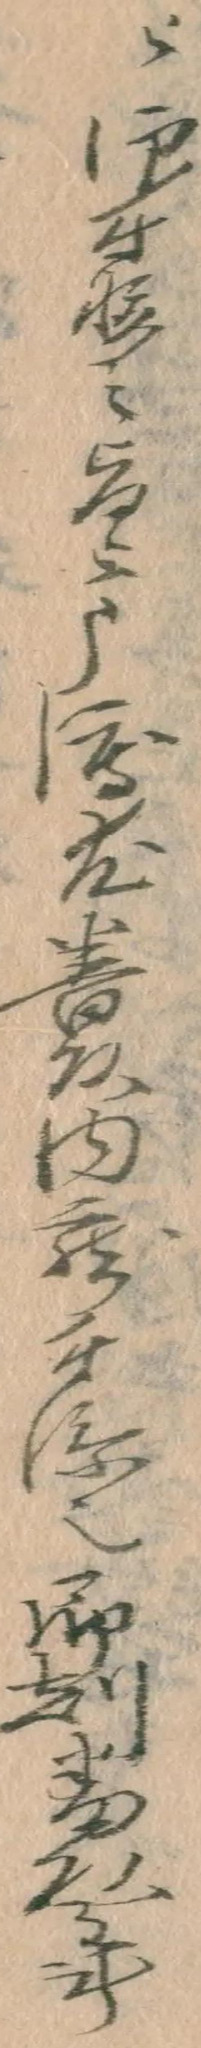被仰付候旨被申渡尤番頭内蔵付添也即刻番頭主斗
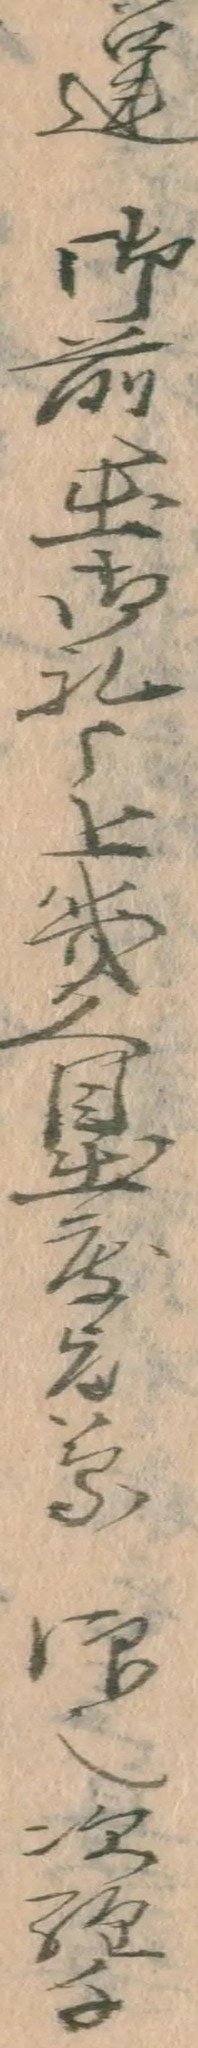召連御前へ出御礼申上幾久目出度旨被仰也次経千
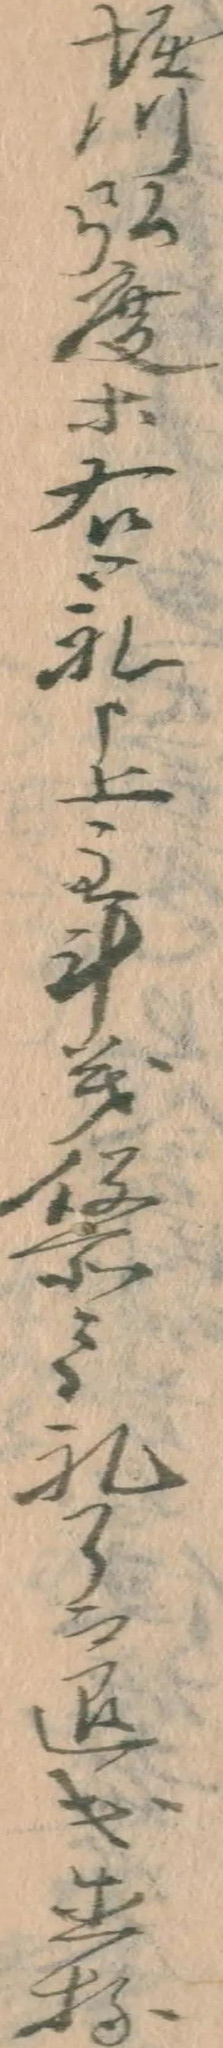堀川弘度等右御礼申上主斗義役所々々礼了而退出直様
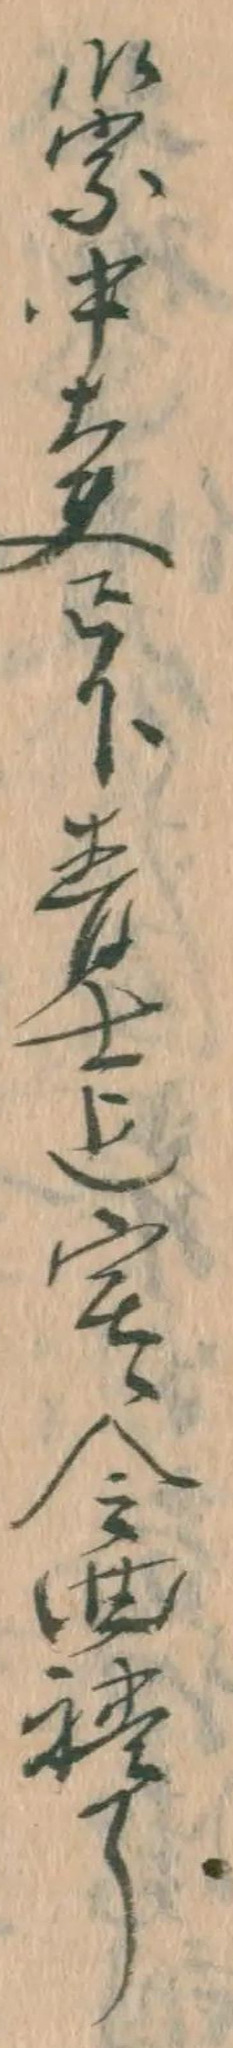御家中大夫已下青士迄宅へ令回禮了
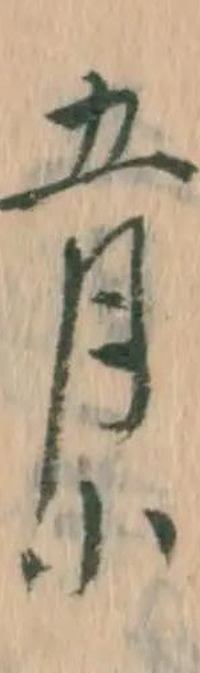五月小
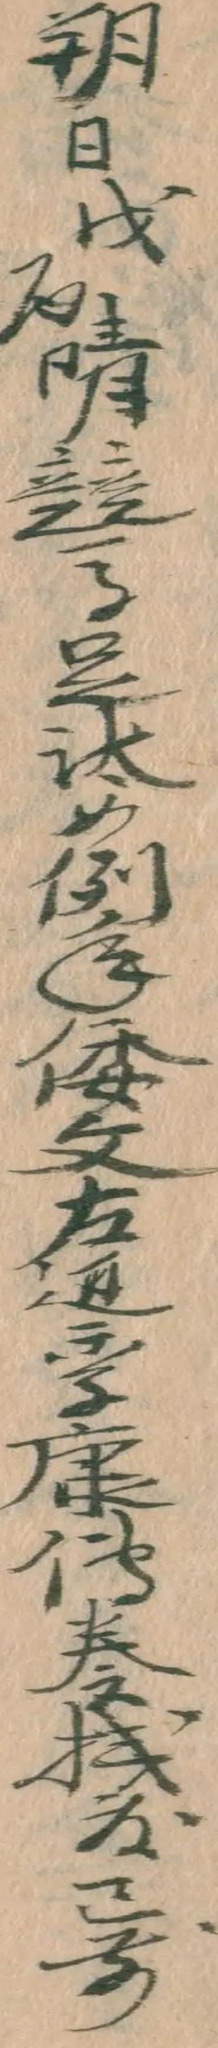朔日戊酉晴競馬足汰如例年倭文左近季康傳奏桟敷已前
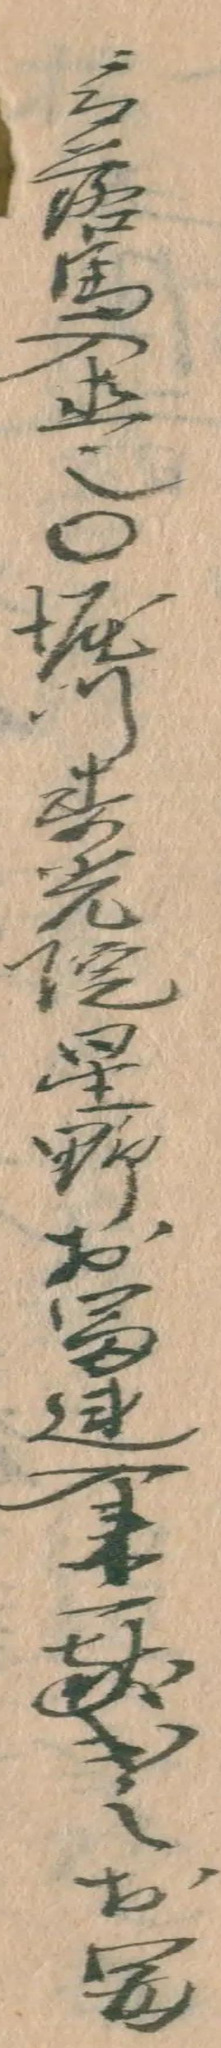ニ而落馬入直也○堀川壽光院星野お冨連入来一献出之お冨
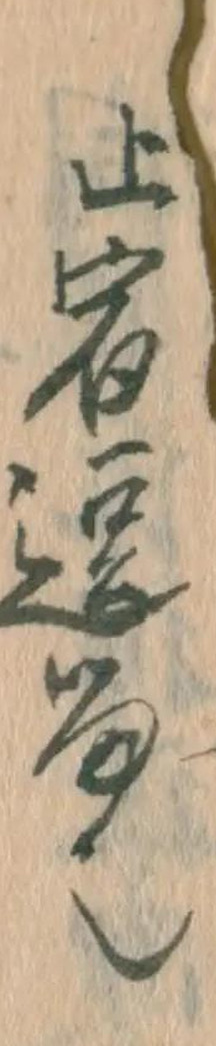止宿逗留也
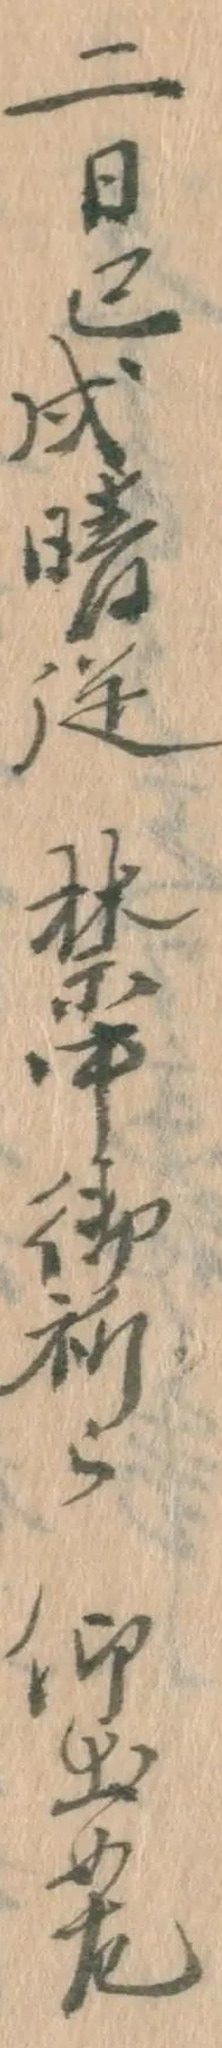二日己戌晴従禁中御祈被仰出如左
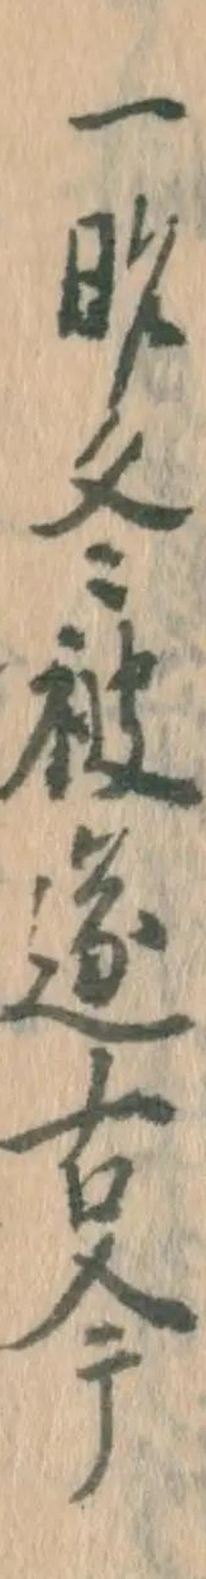一昨冬被遂古今
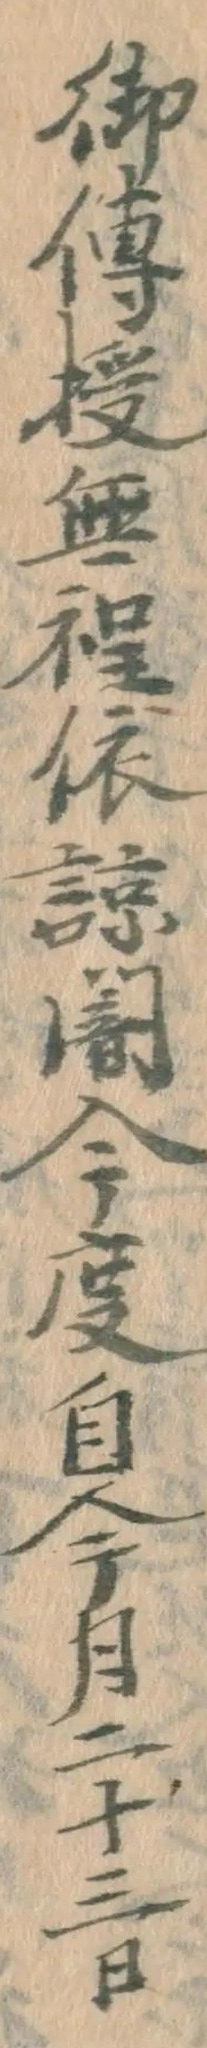御傳授無程依諒闇今度自今月二十三日
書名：賀茂社記録. 第69冊
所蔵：国立国会図書館 National Diet Library, JAPAN
